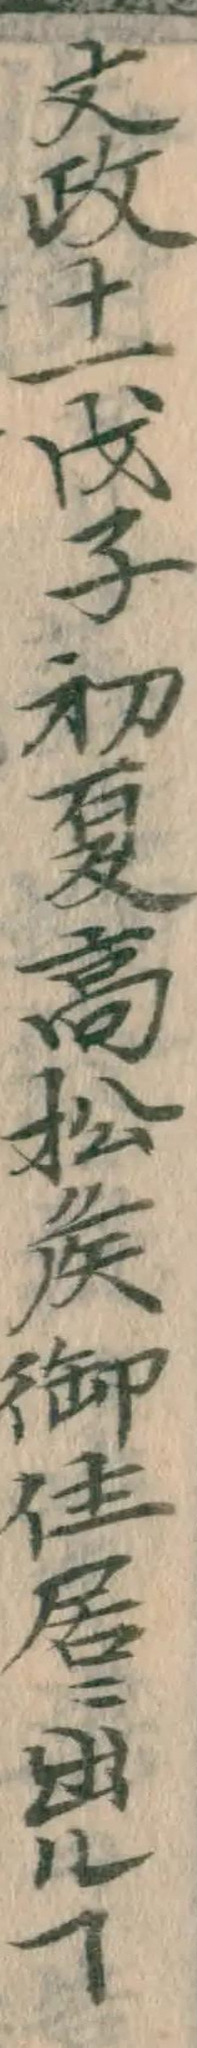文政十一戊子初夏高松矦御住居ニ出ルコト
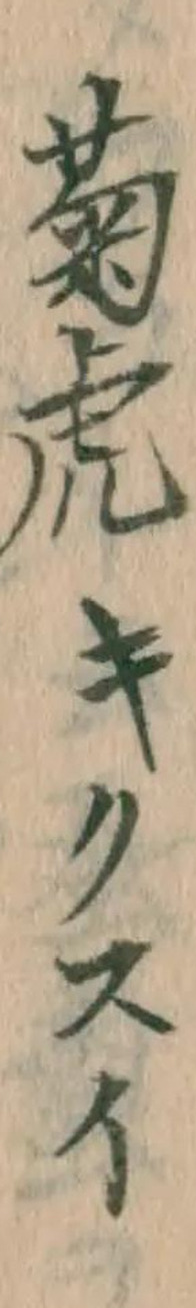菊虎キクスイ
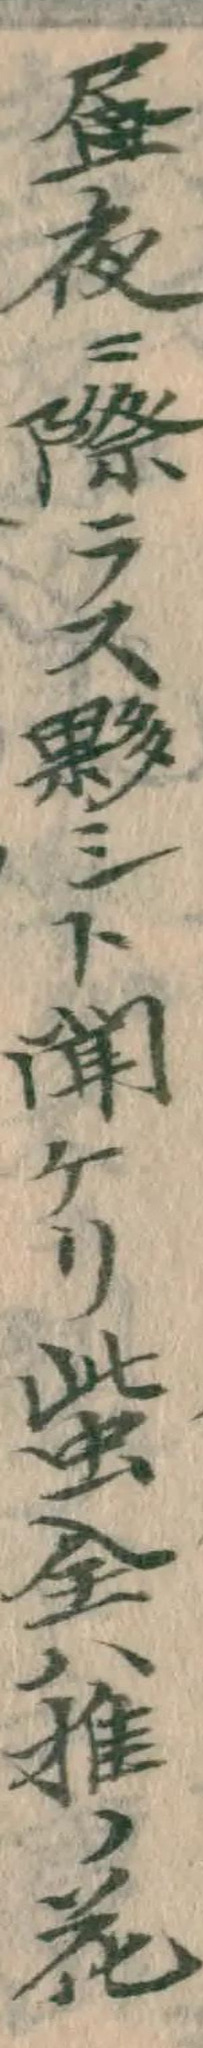昼夜ニ際ラス夥シト聞ケリ此虫全ハ椎ノ花
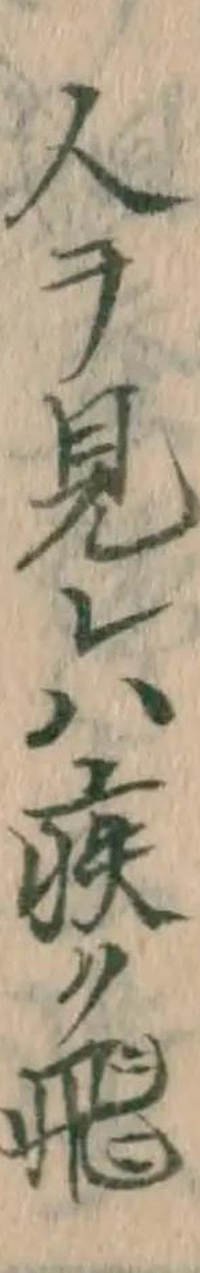人ヲ見レハ疾ク飛
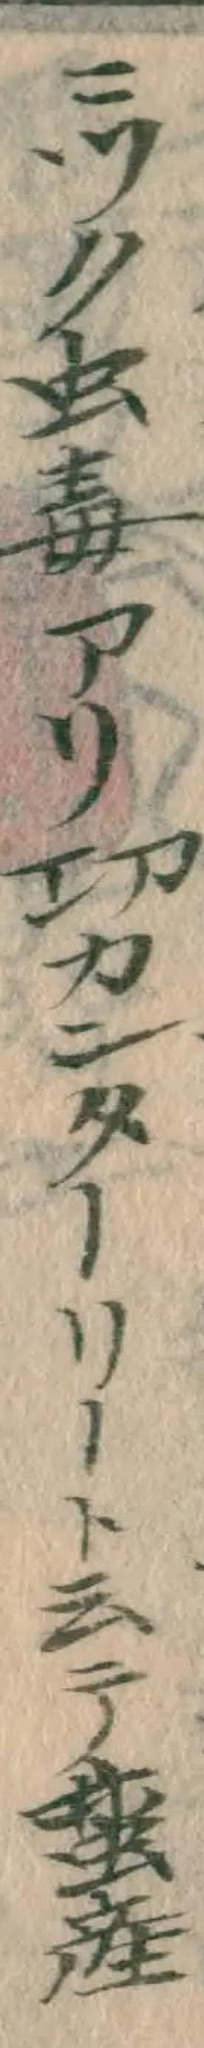ニツク虫毒アリ㓛カンターリート云テ蛮産
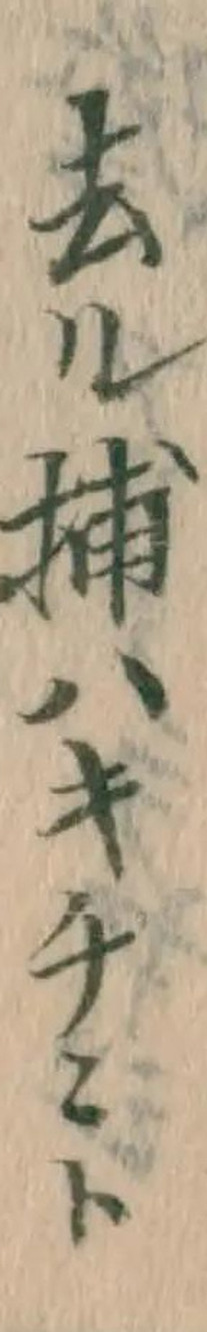去ル捕ハキチ々ト
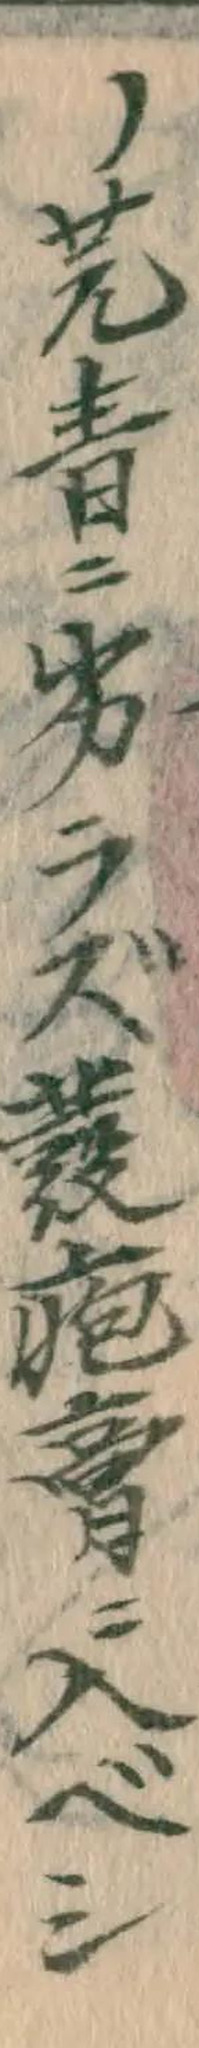ノ芫青ニ劣ラズ發疱膏ニ入ベシ
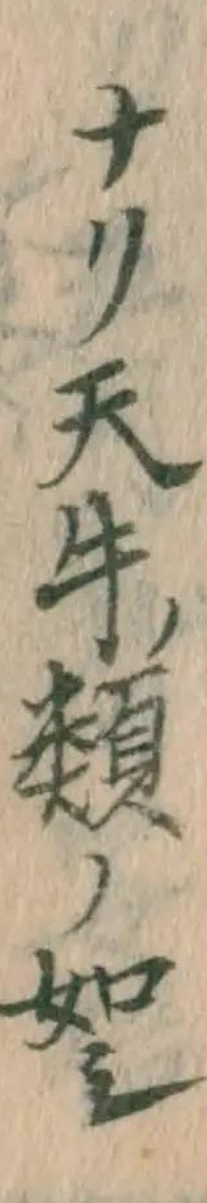ナク天牛ノ類ノ如シ
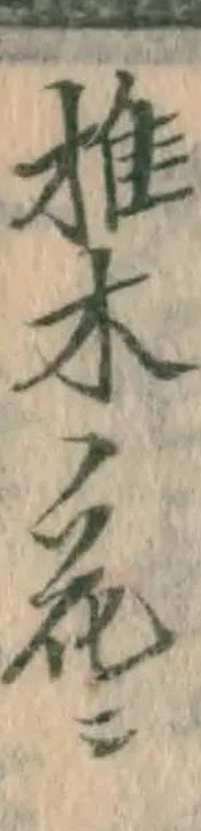椎木ノ花ニ
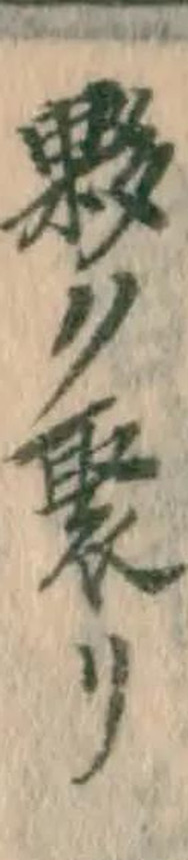夥ク聚リ
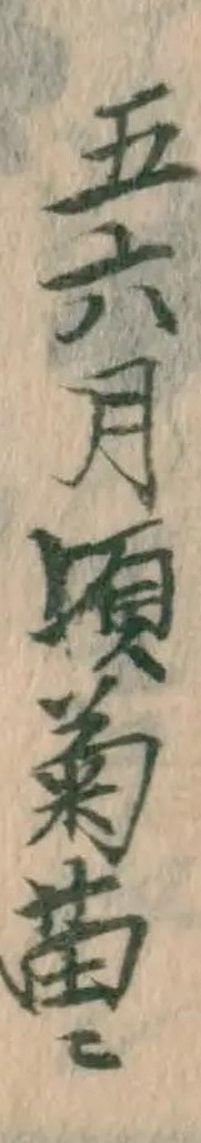五六月頃菊苗ニ
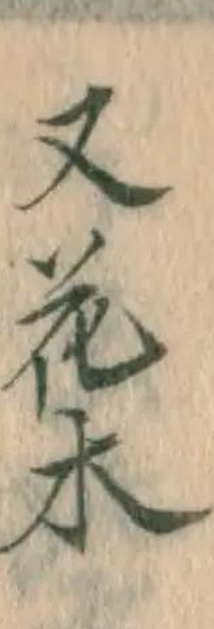又花木
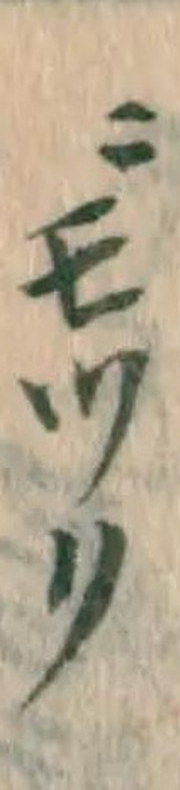ニモツク
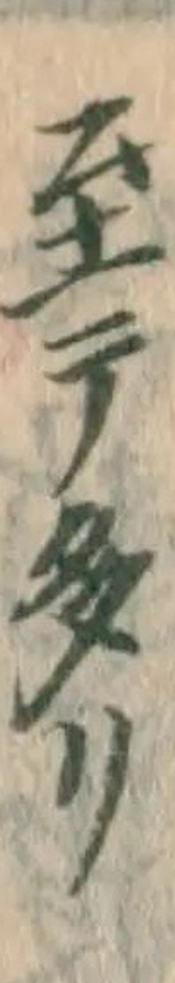至テ多ク
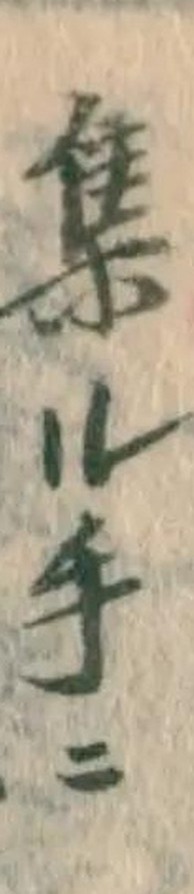集ル手ニ
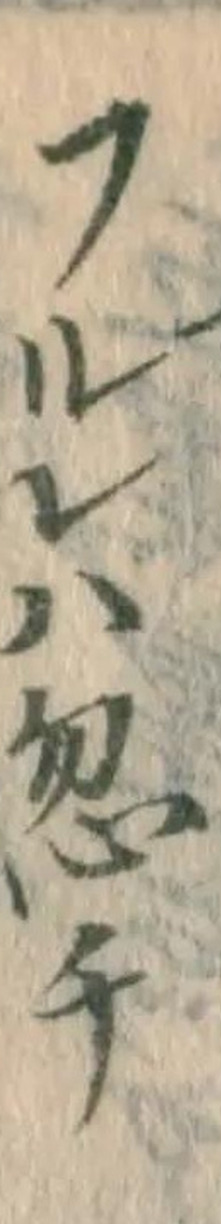フルレハ忽チ
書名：千蟲譜 3巻. [2]
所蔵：国立国会図書館 National Diet Library, JAPAN
